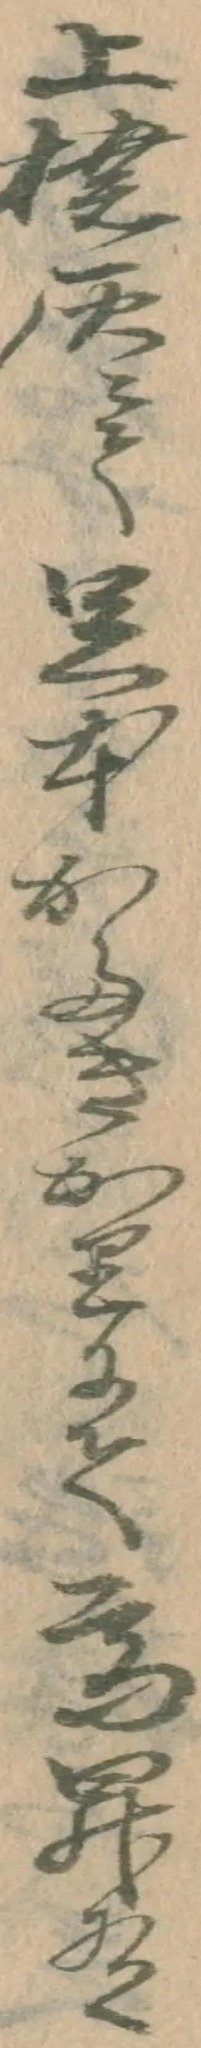上焼灰にて足本か多か里尓て高昇有
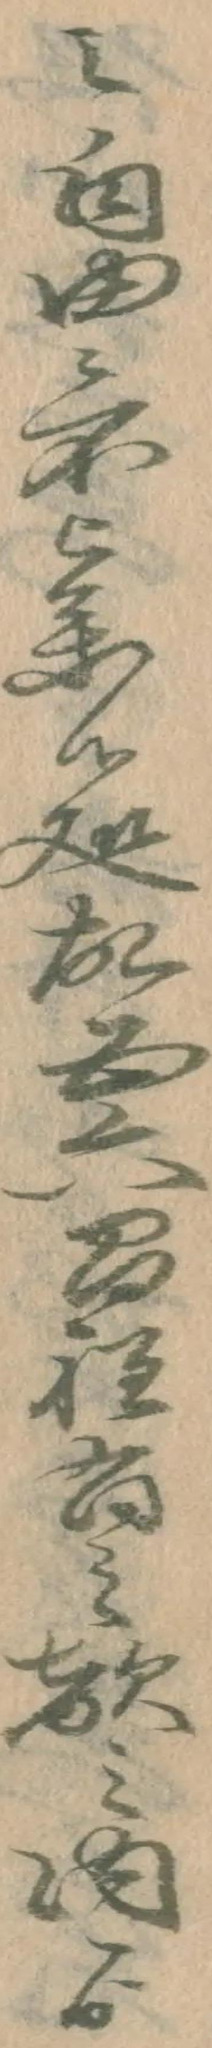之自由に不被参候処故五六間程有之敵之内ゟ
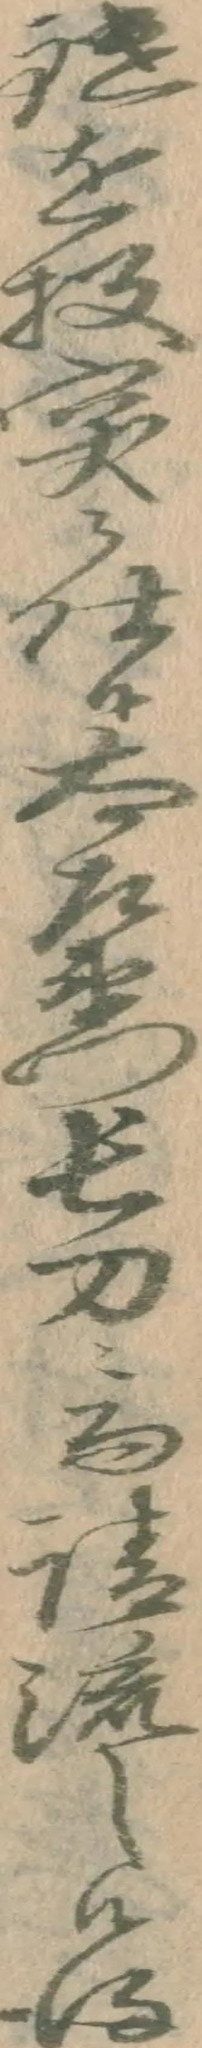鑓を投突に仕候太左衛門長刀に而請流し候得
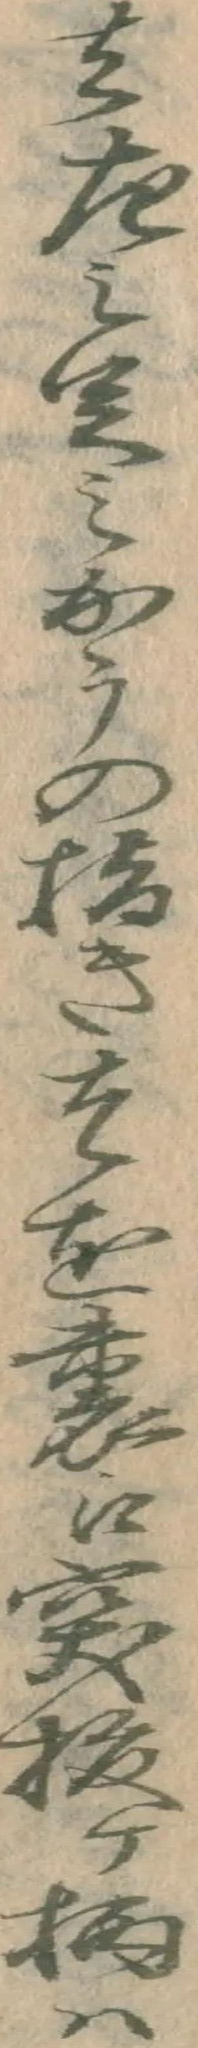者左之足之かうの指き者を裏江突抜け柄は
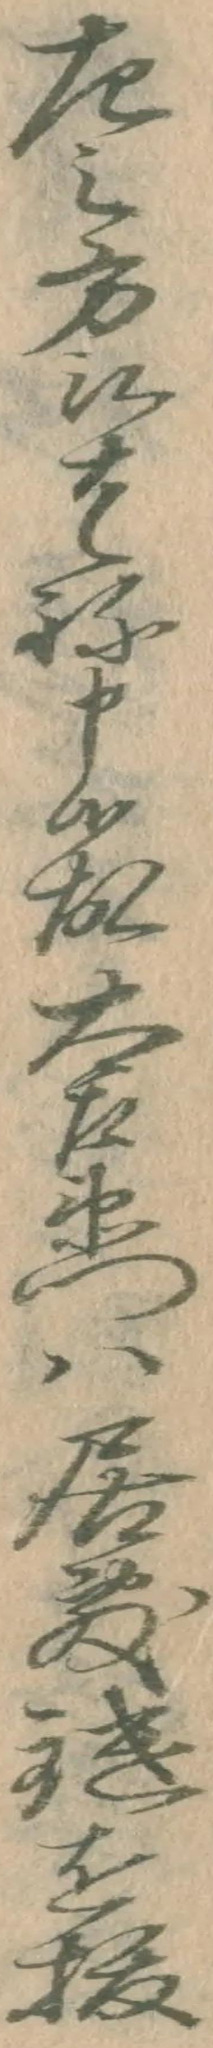左之方江者祢申候故太左衛門は居敷鑓を抜
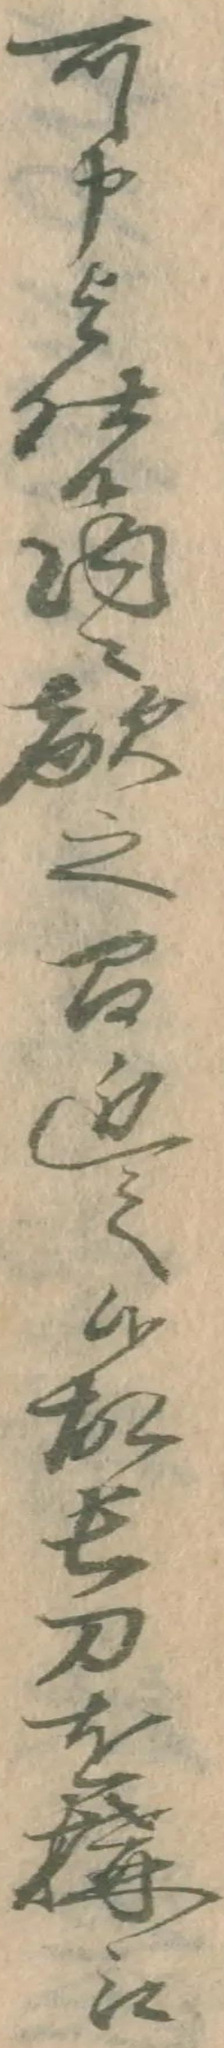可申与仕候内に敵之間近く候故長刀を構江
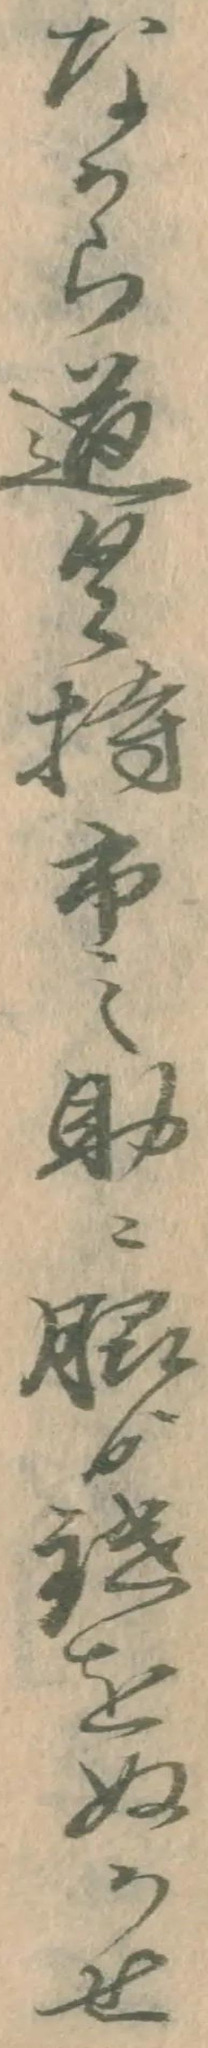なから道具持市之助に脇ゟ鑓をぬかせ

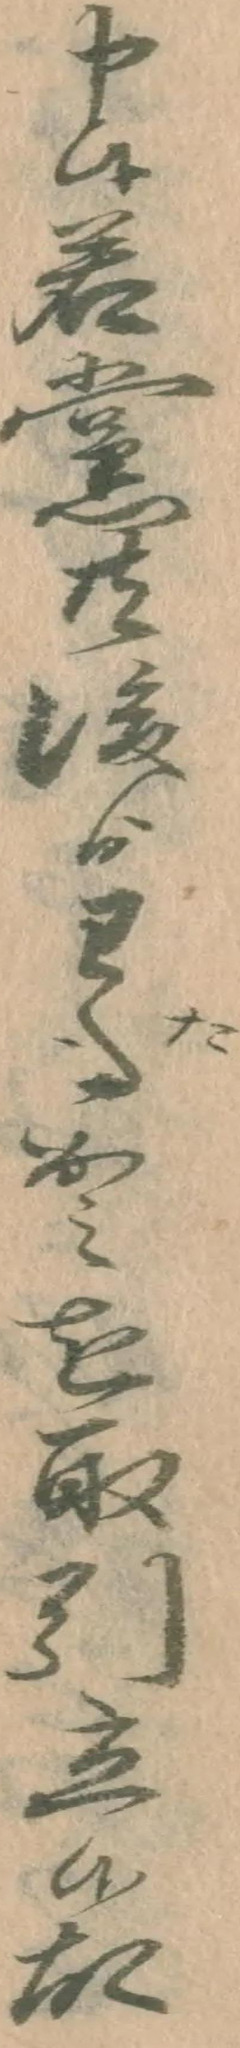申候若党共後ゟ已たかみを取引立候故
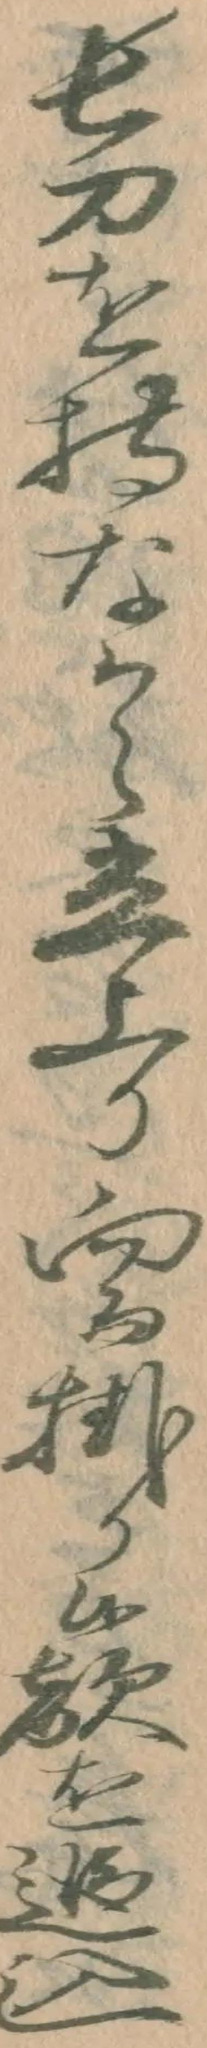長刀を持なから立上り向而掛り候敵を追込
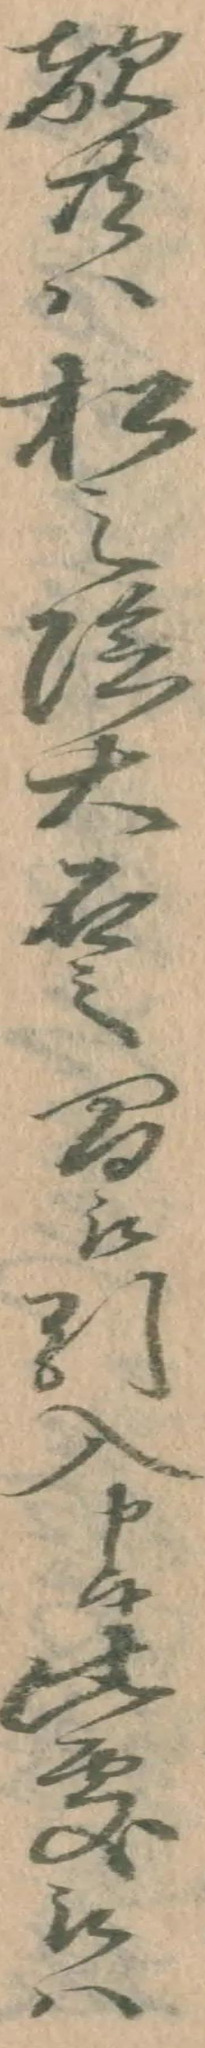敵共は松之陰大石之間江引入申候此處江は
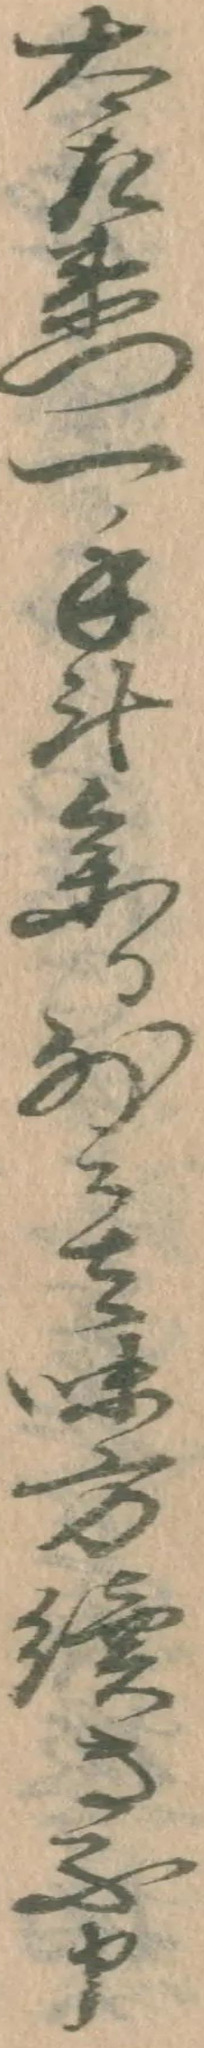太左衛門一手斗参り外に者味方続きふ申
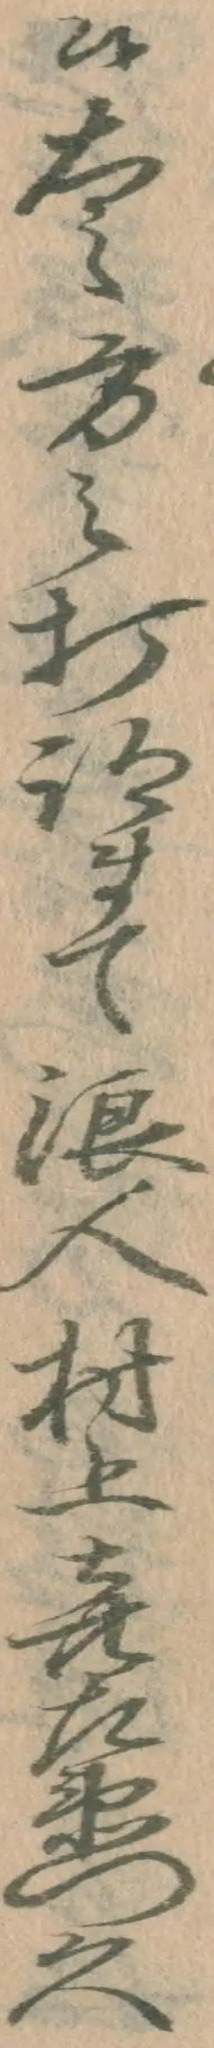候右之方之打跡まて浪人村上喜左衛門久
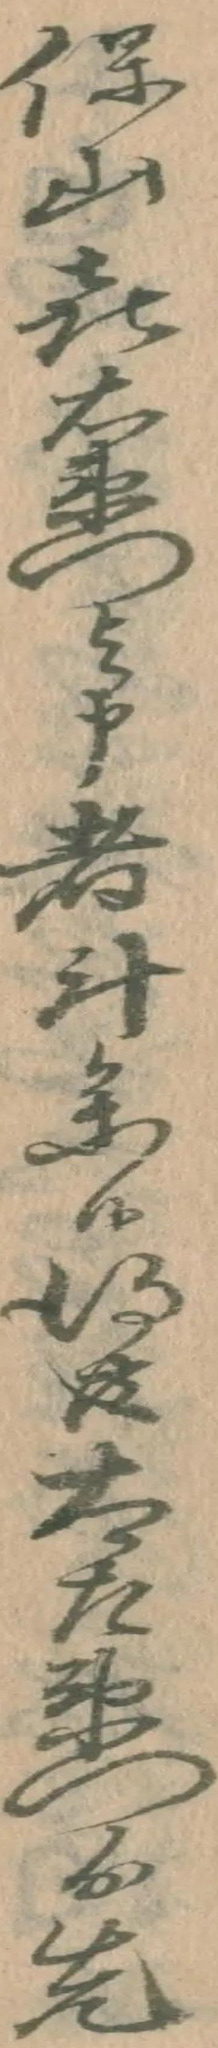保山喜右衛門与申者斗参候得共太左衛門ゟ先
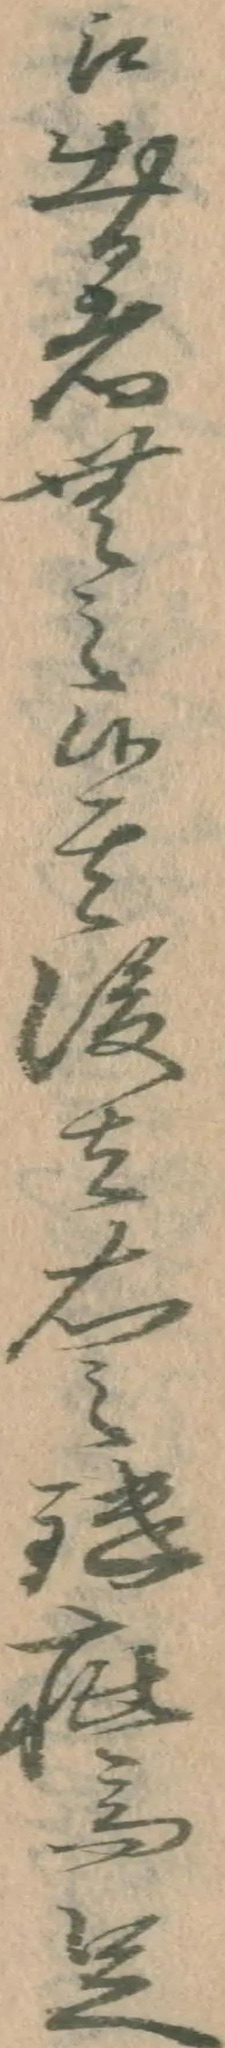江出る者無之候其後者右之鑓疵に而足
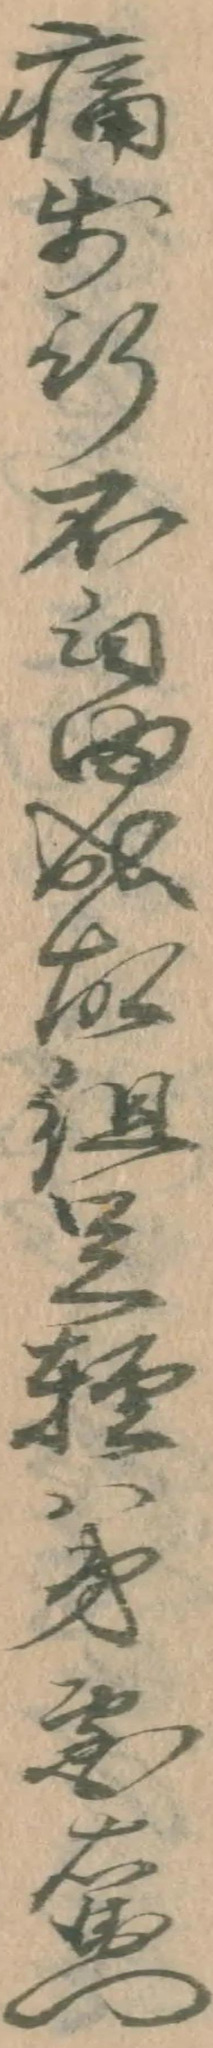痛歩行不自由成故組足軽は弟敷右衛門
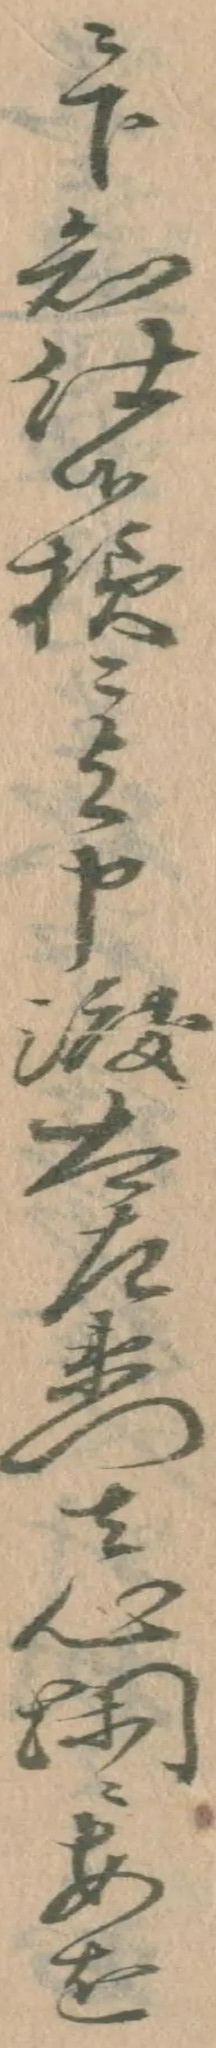に下知仕候様に与申渡太左衛門者心閑にあを
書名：切支丹御退治記 49巻. [8]
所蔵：国立国会図書館 National Diet Library, JAPAN
